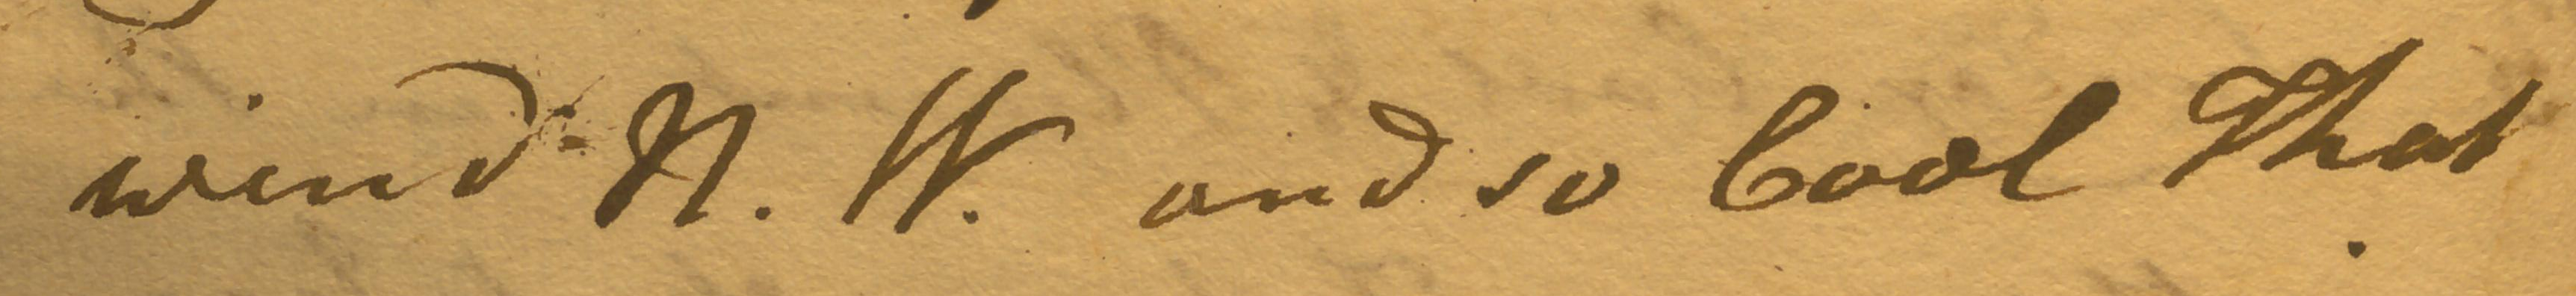wind N. W. and so Cool that
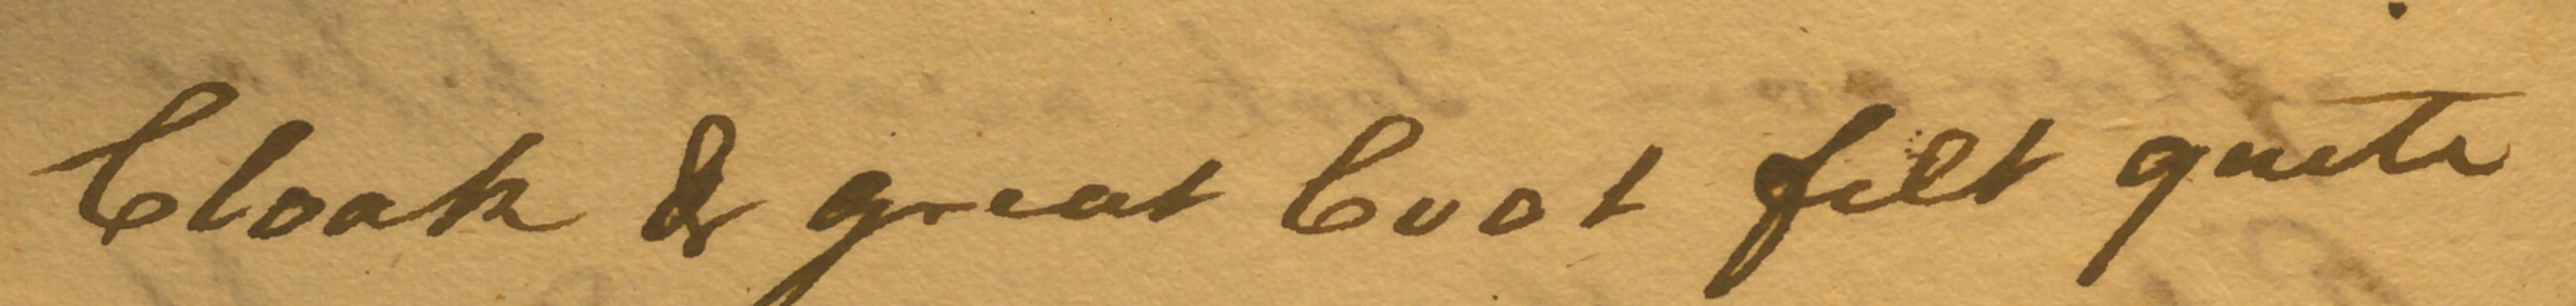Cloak & great Coat felt quite
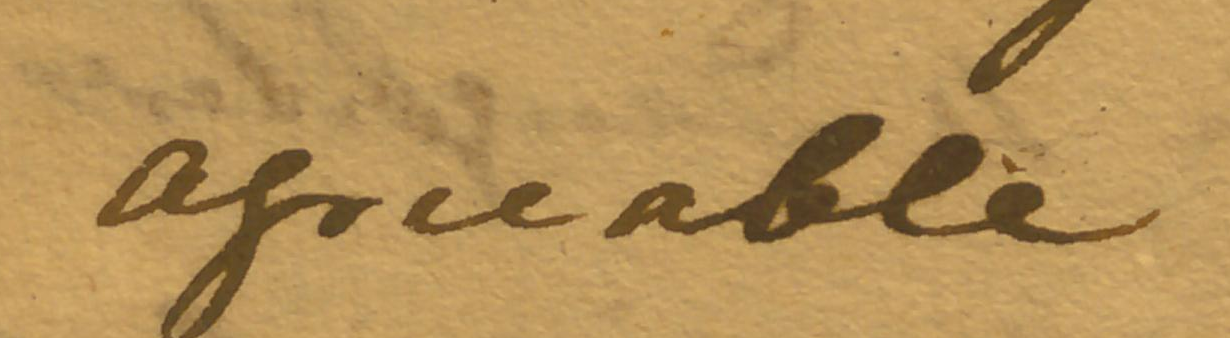agreeable
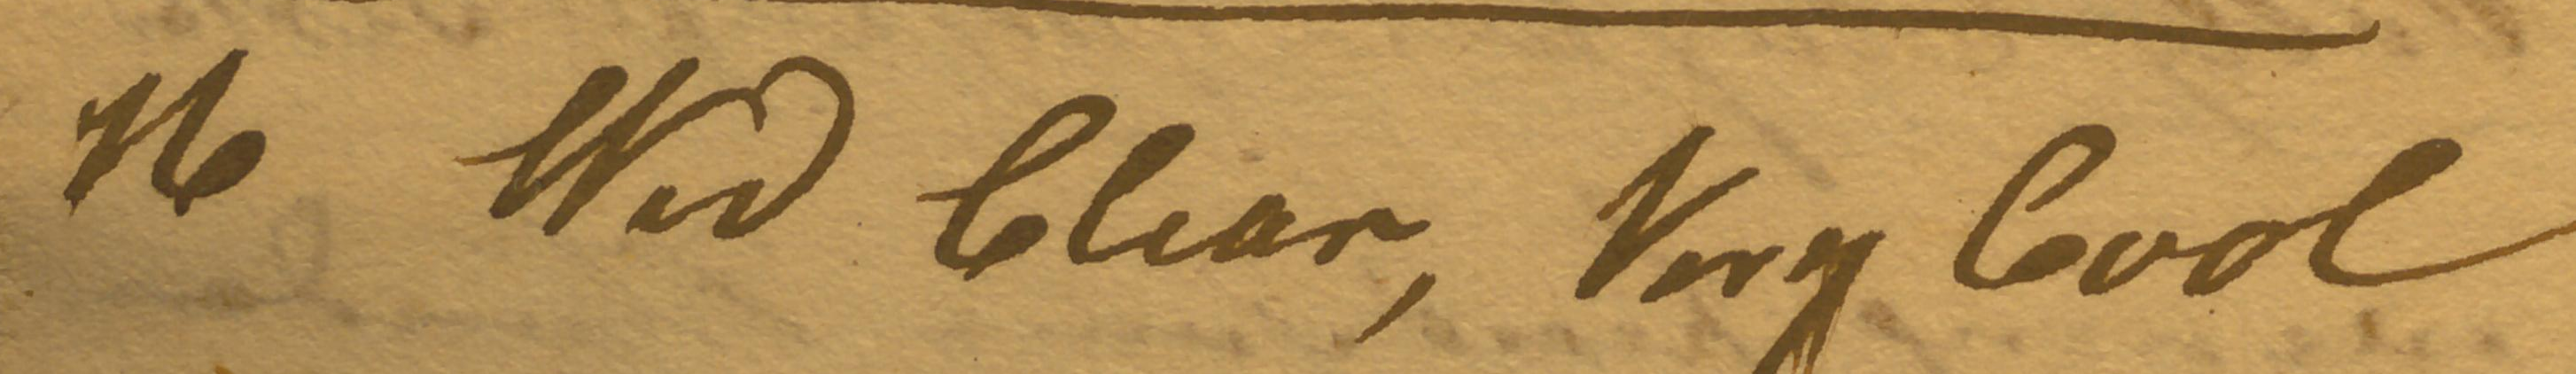16 Wed Clear, Very Cool
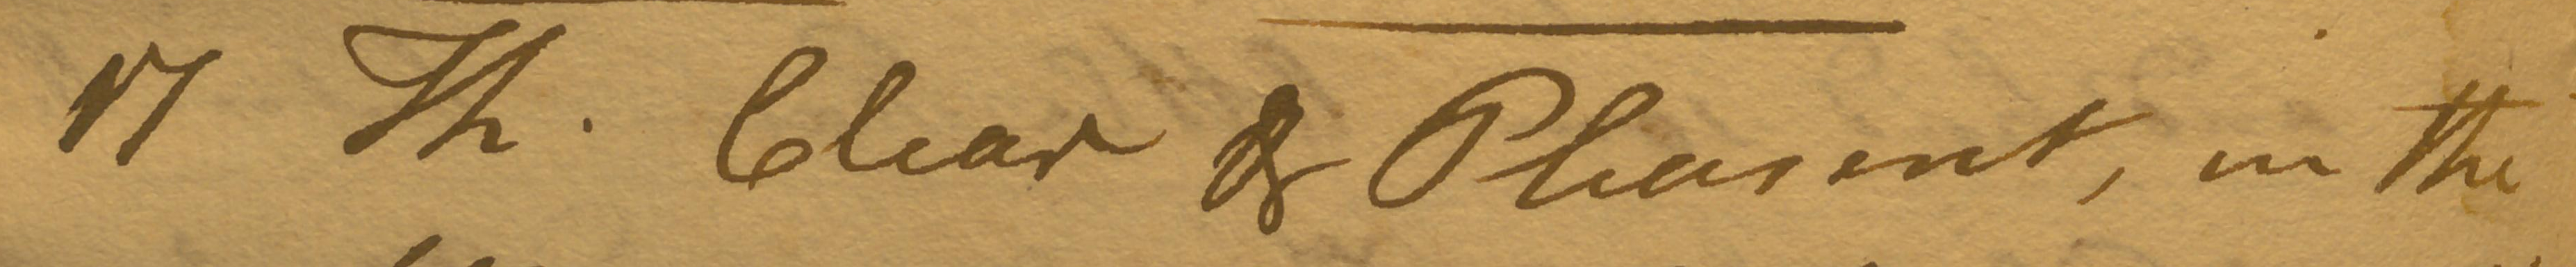17 Th. Clear & Pleasent, in the
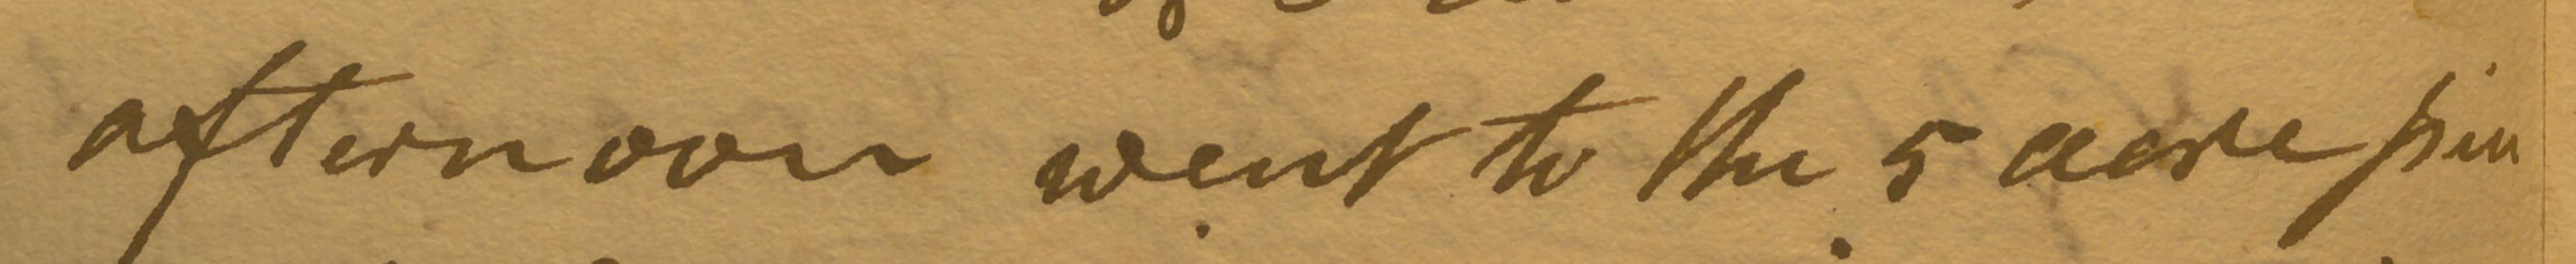afternoon went to the 5 acre pice
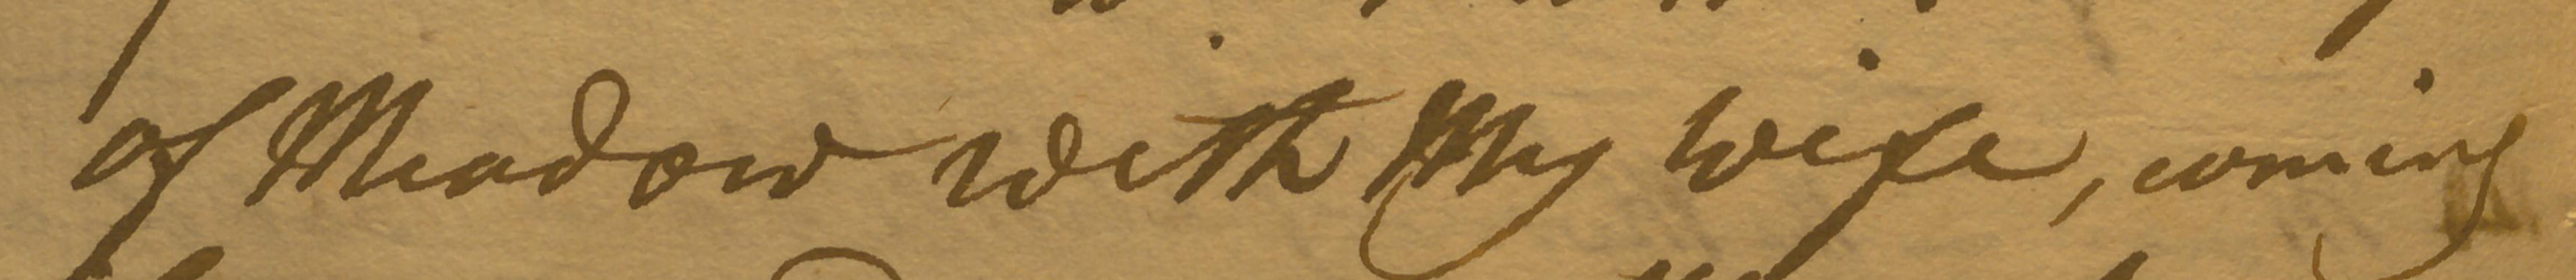of Meadow with My wife, coming
